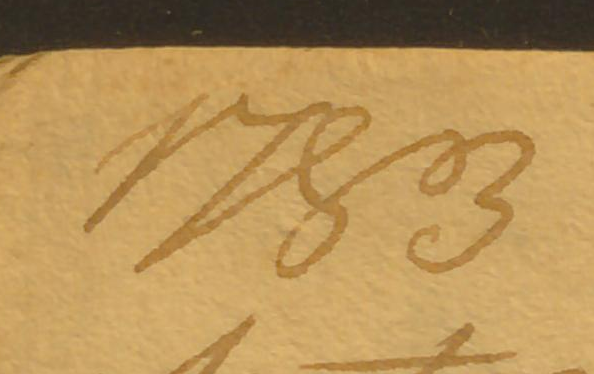1783
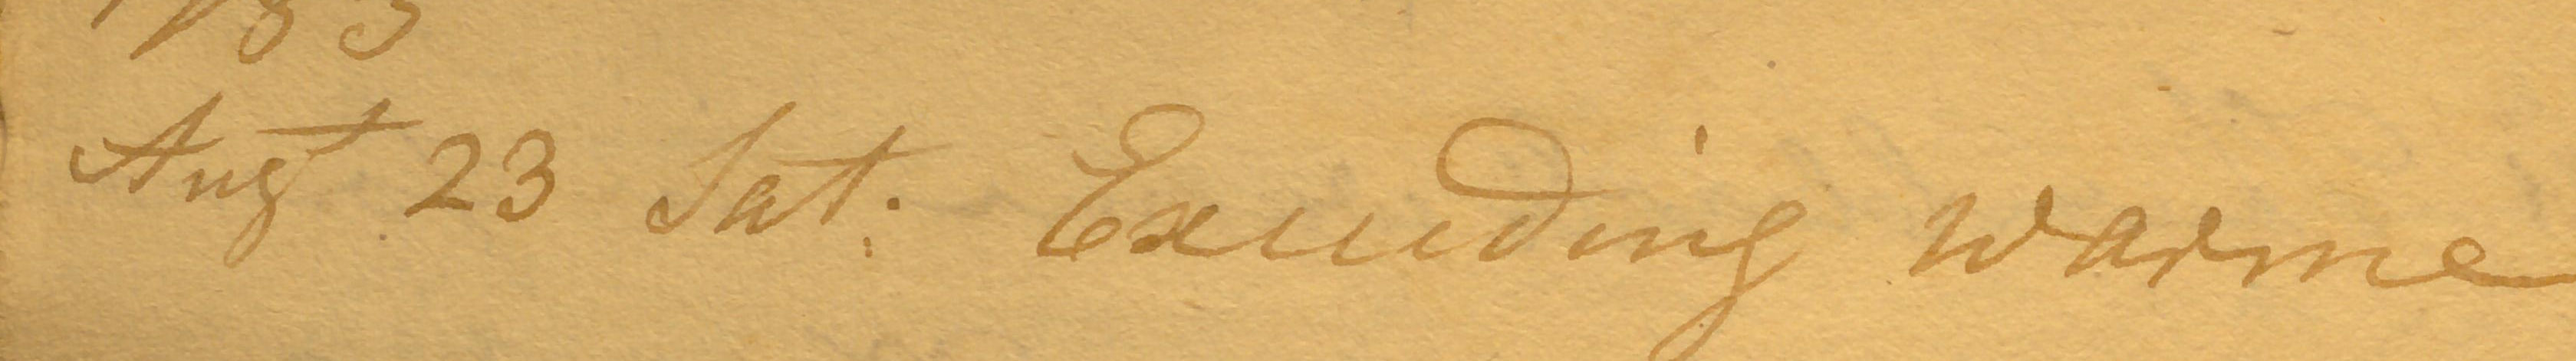Aug^t. 23 Sat. Exceeding warme
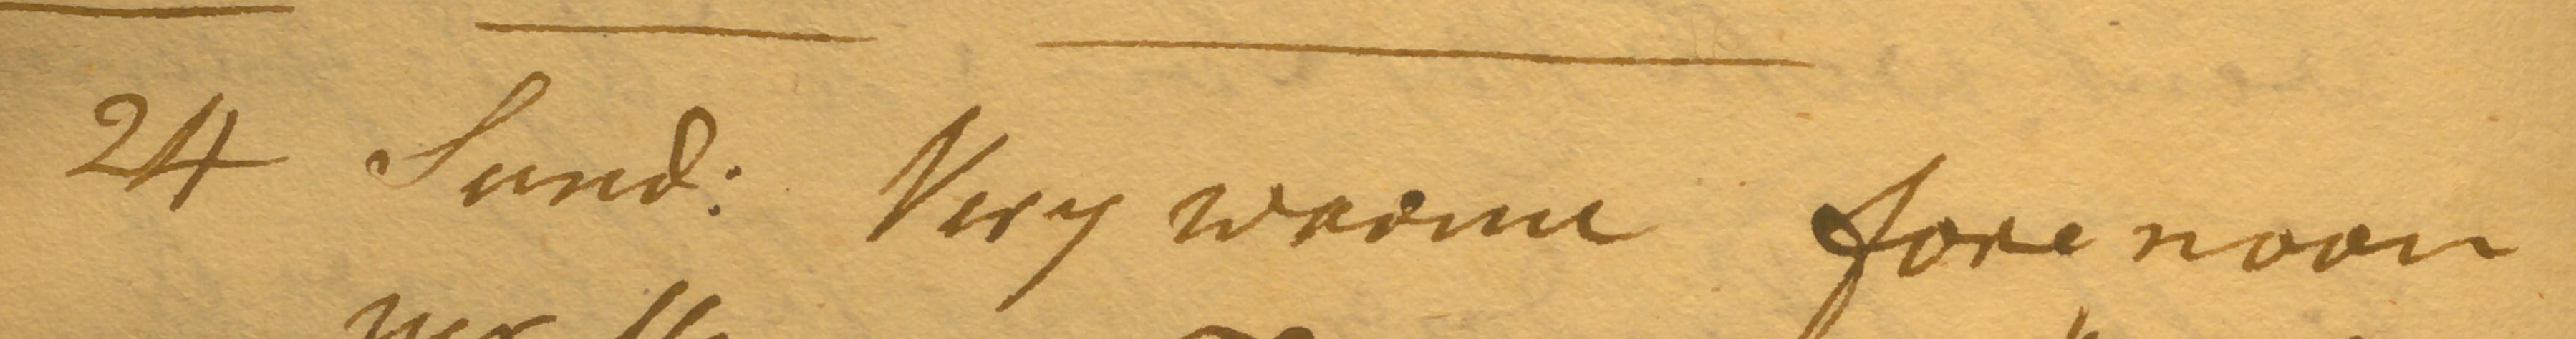24 Sund: Very warme forenoon
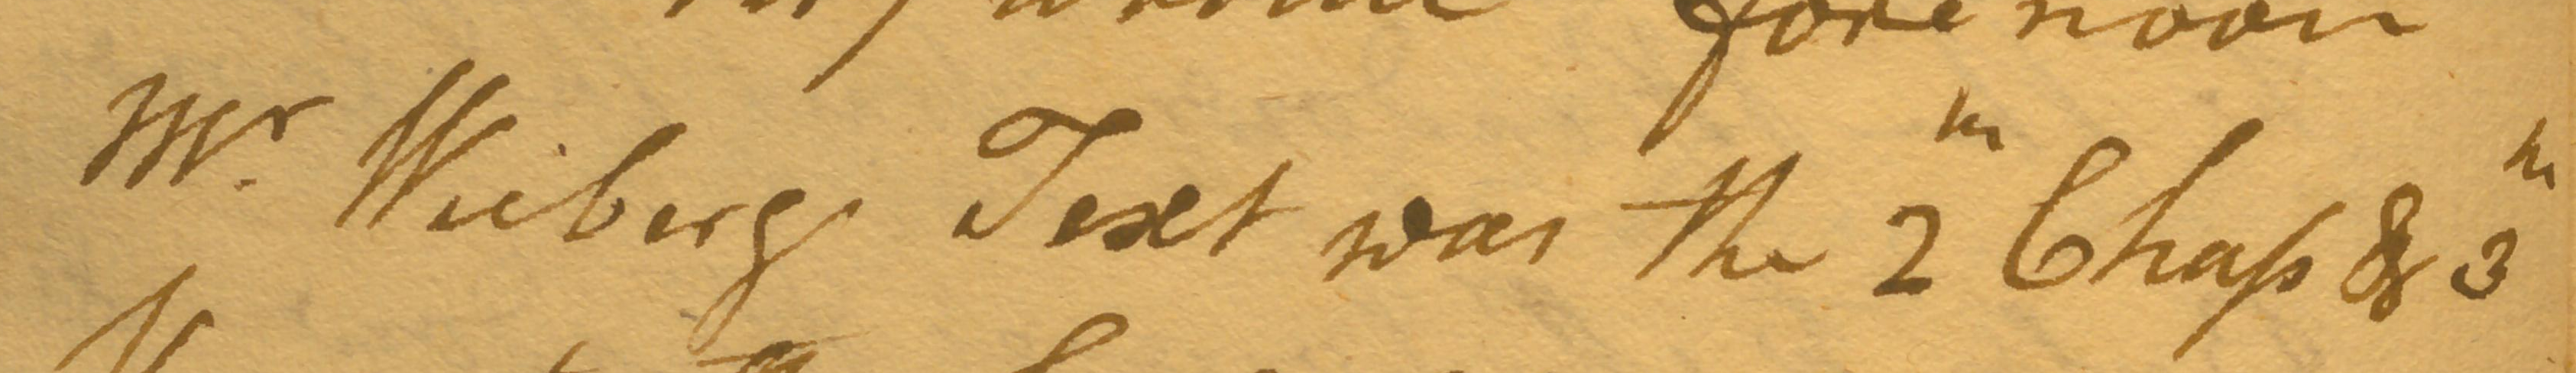M^r. Weibergs Text was the 2^th Chap & 3^th
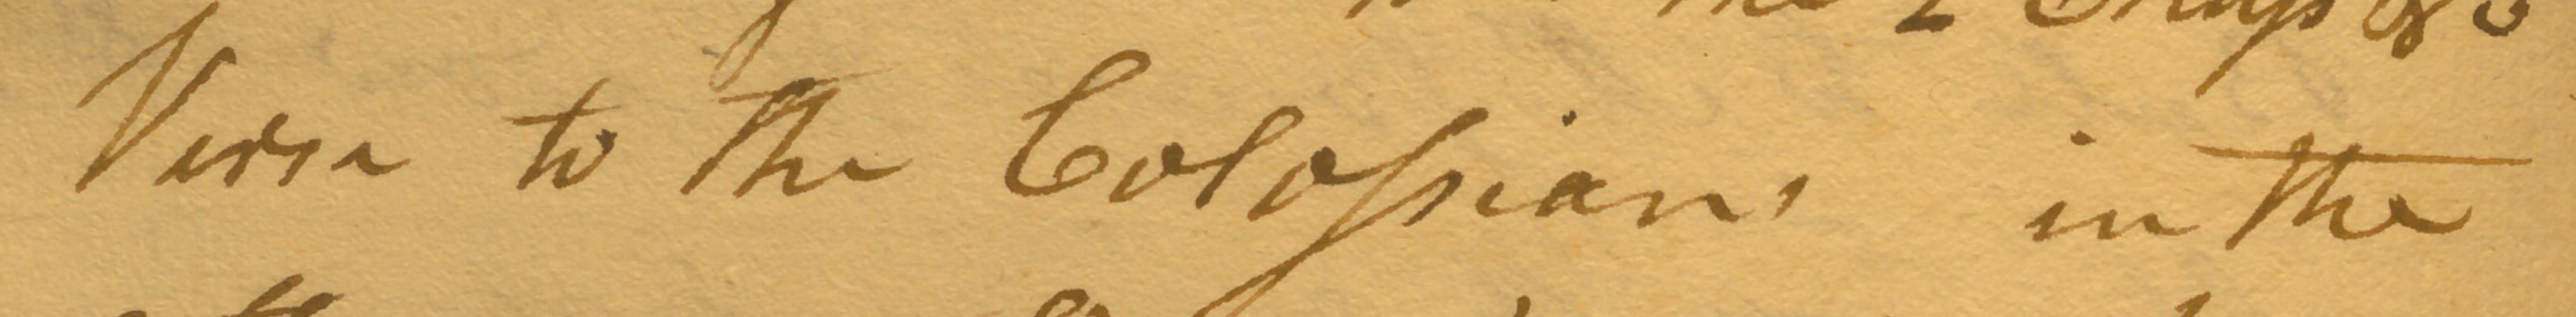Verse to the Colossians, in the
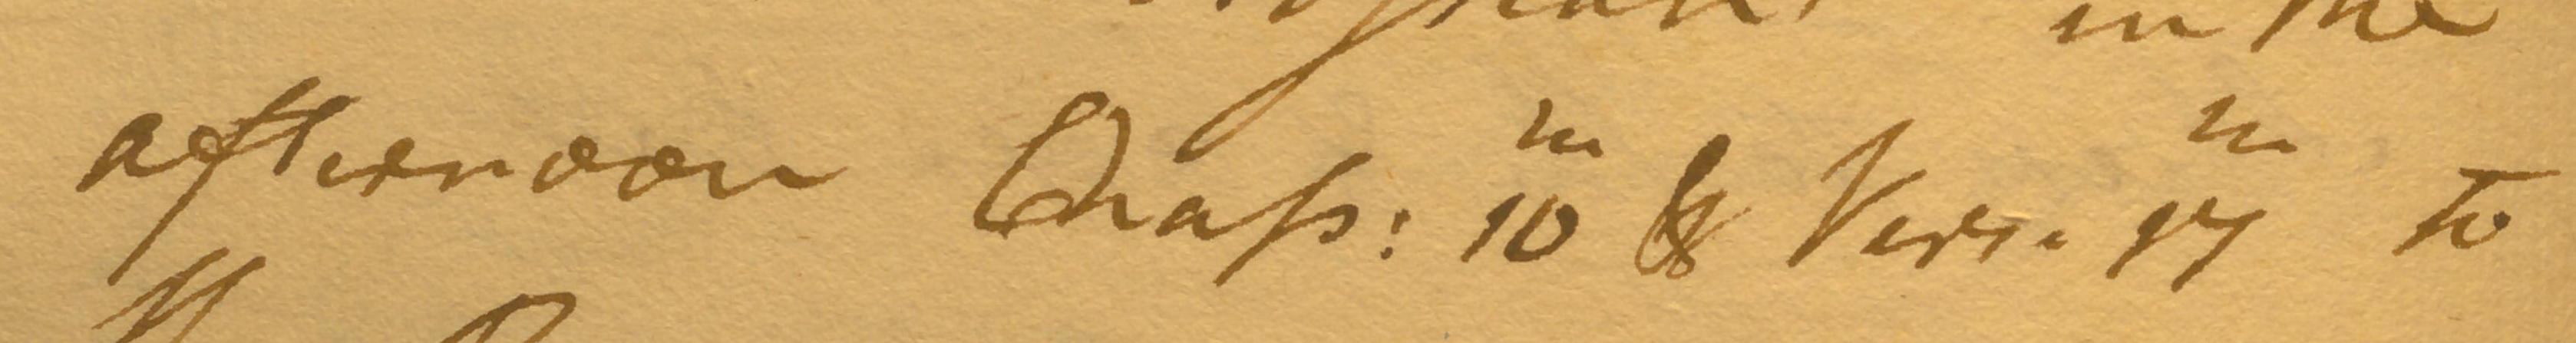afternoon Chap: 10^th & Verse 17^th to
